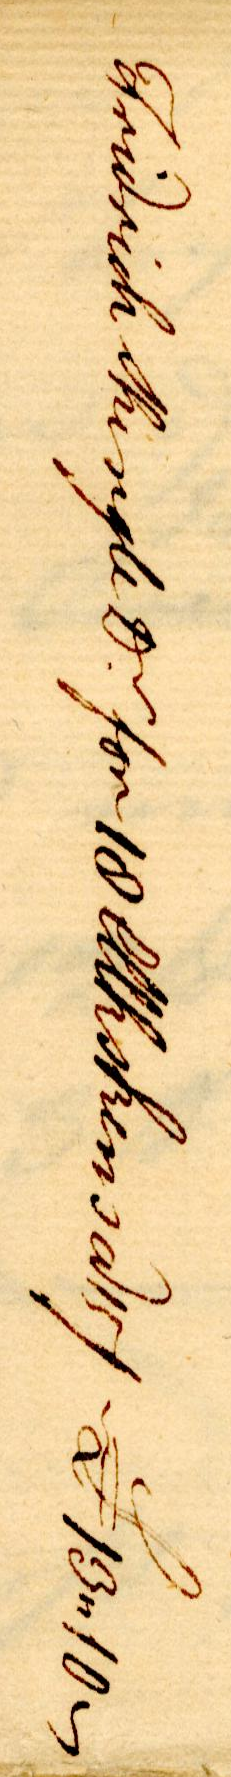Fridrich the rgle D^r for 10 Elk Skins @15s £13..10-
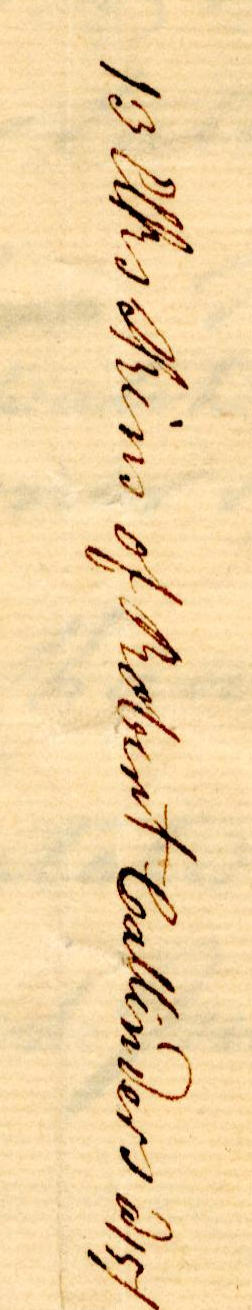13 Elks Skins of Robert Callinders @ 15s
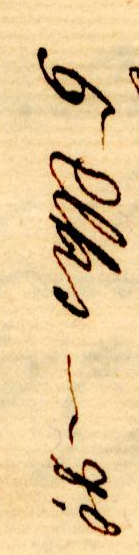5 Elks- D^o.
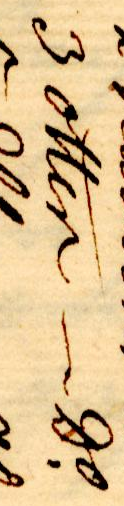3 Otter- D^o.
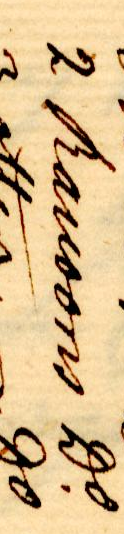2 Raccoons D^o.
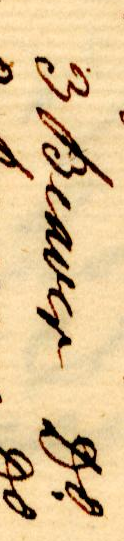3 Beaver D^o.
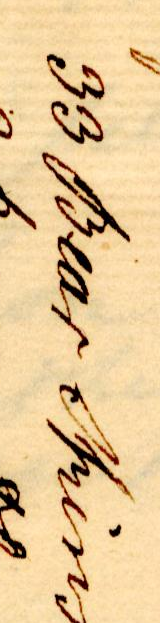33 Bear skins
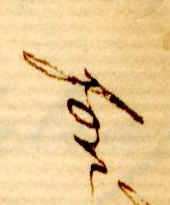for
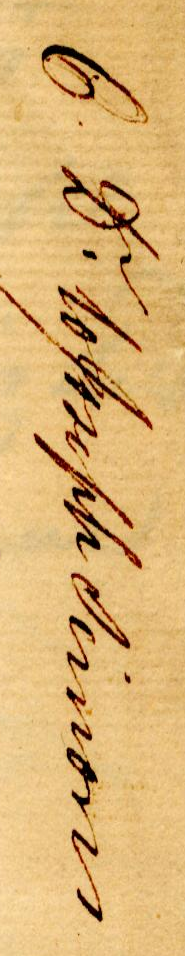6 D^r. to Joseph Simons
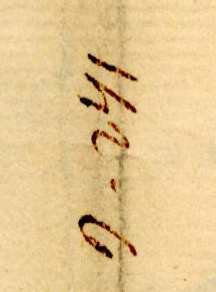142.6
